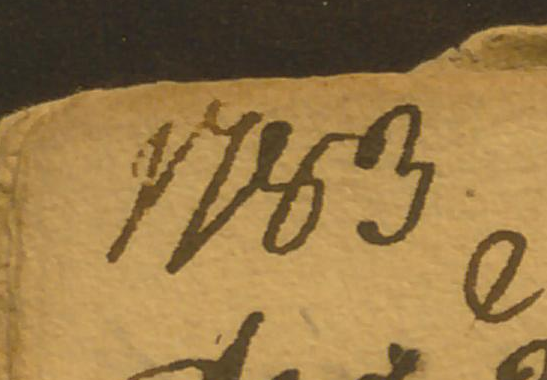1783
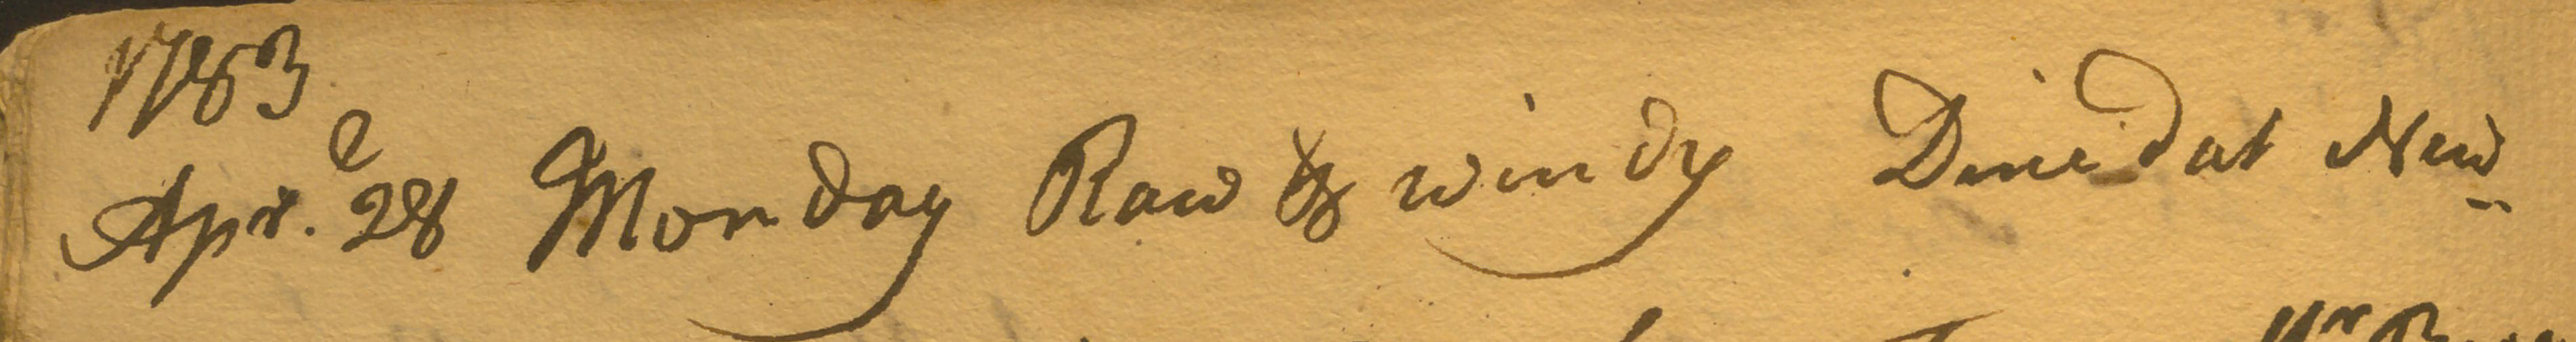Apr^l. 28 Monday Raw & windy Dine'd at New
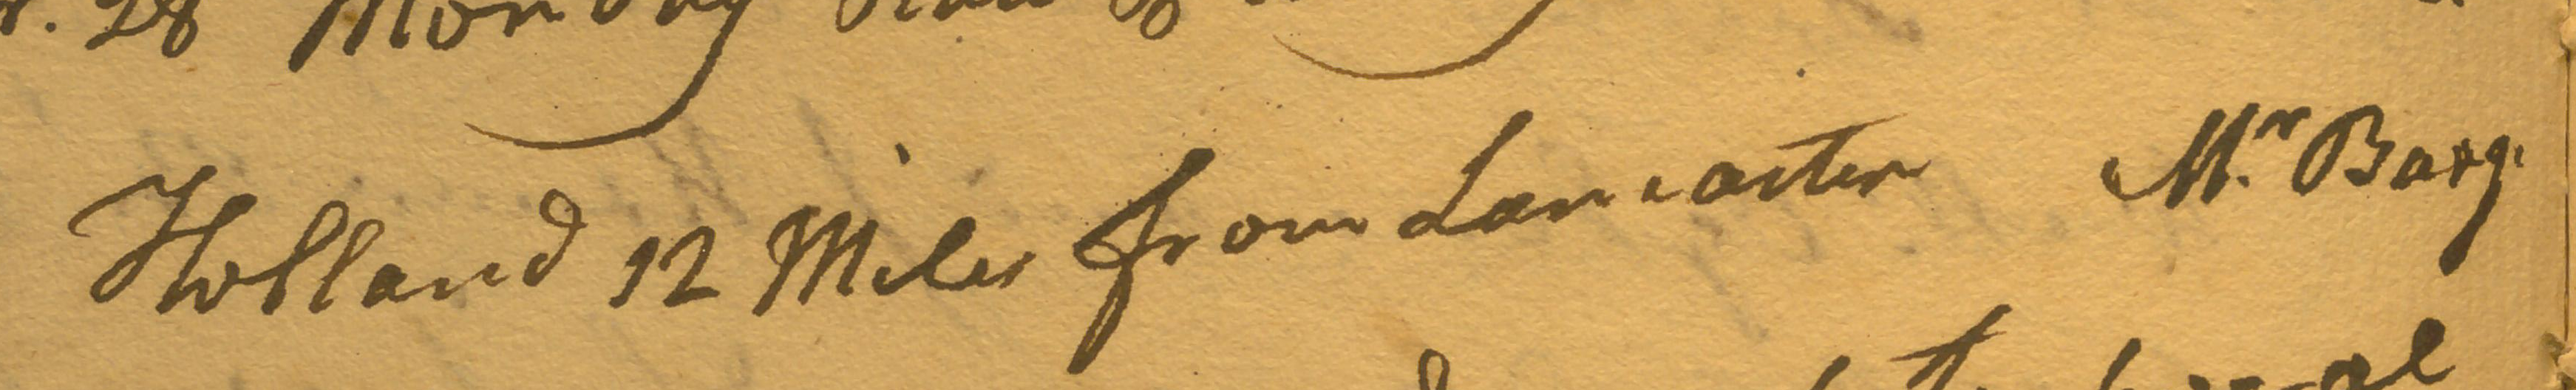Holland 12 Miles from Lancaster M^r. Barge
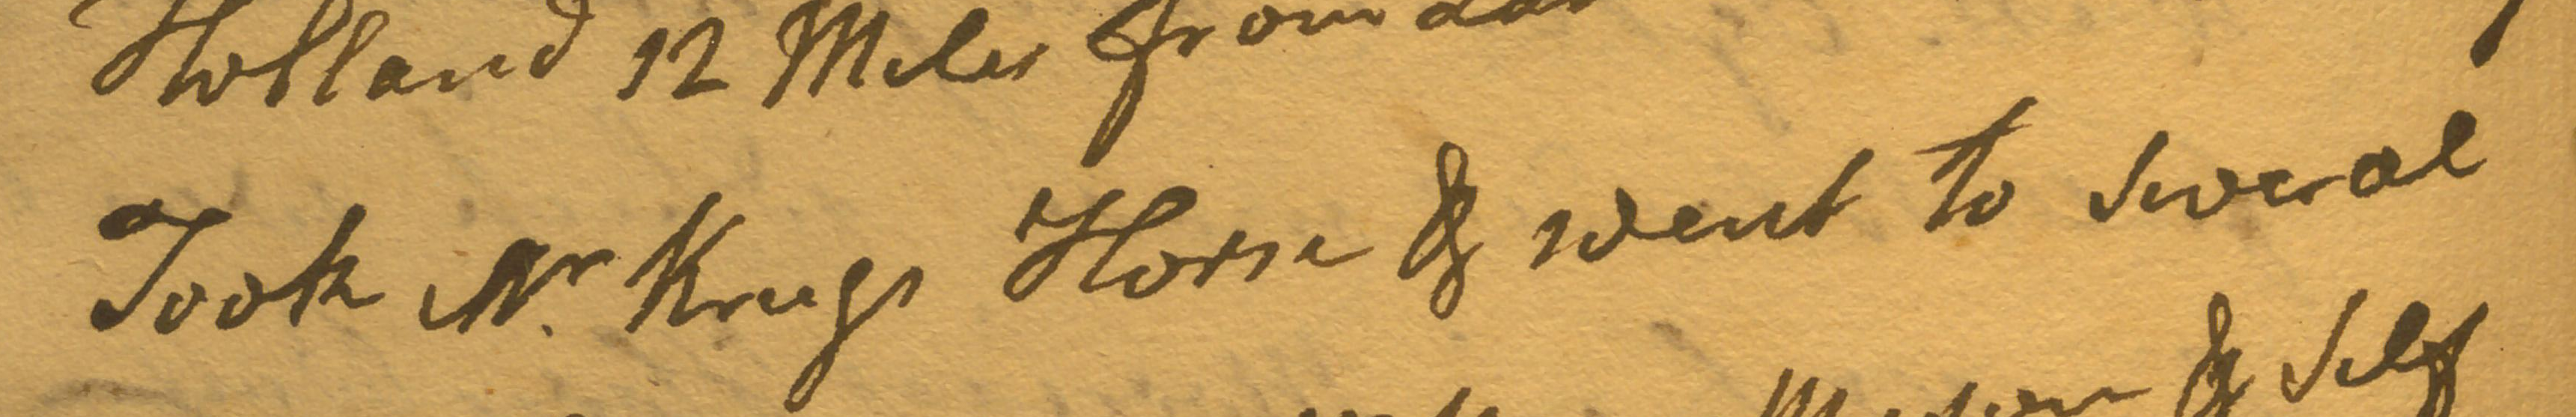Took M^r. Krugs Horse & went to several
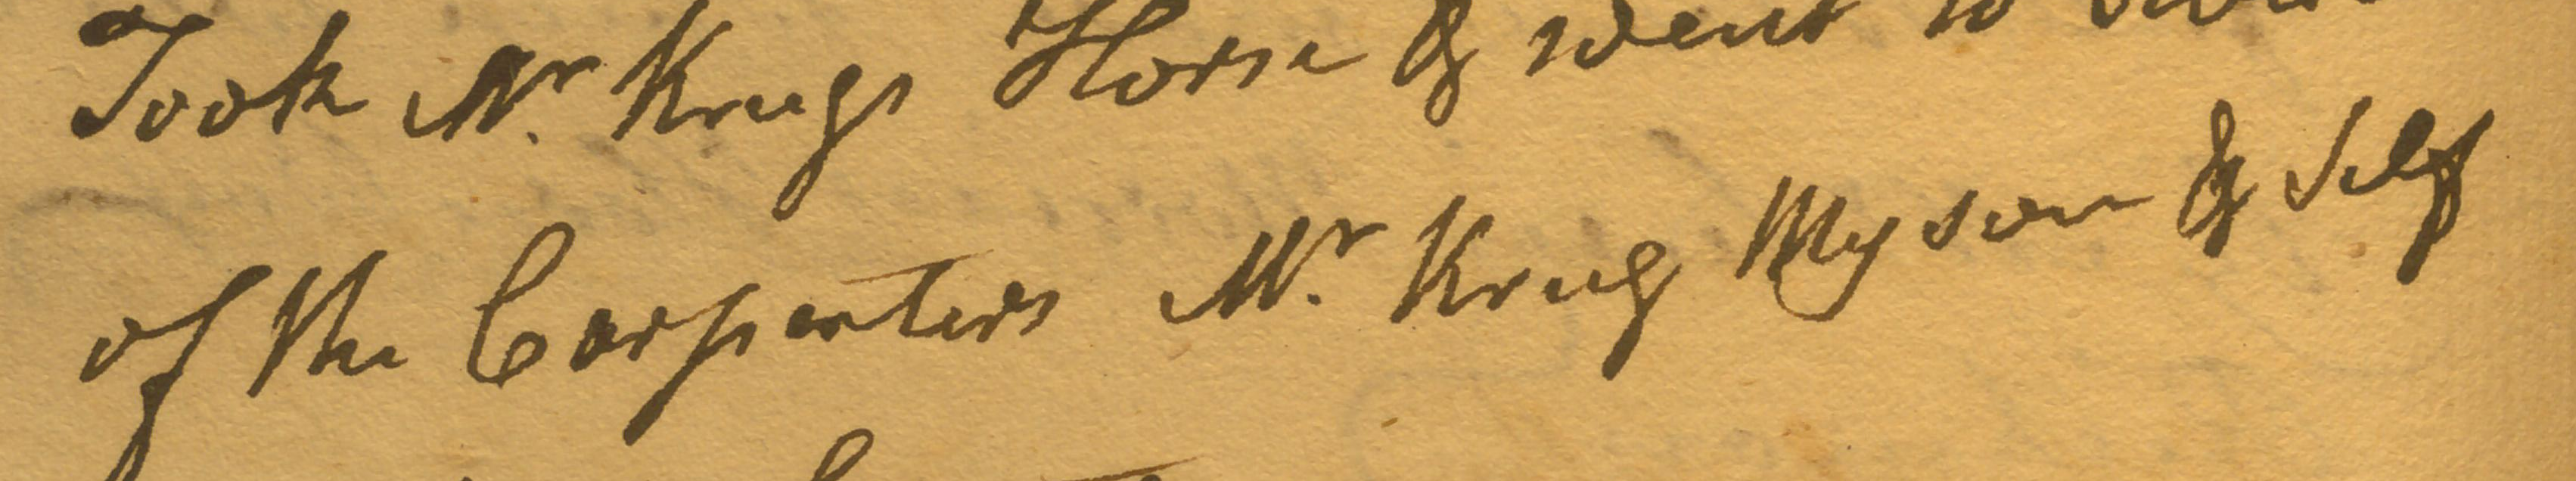of the Carpenters M^r. Krug My son & self
